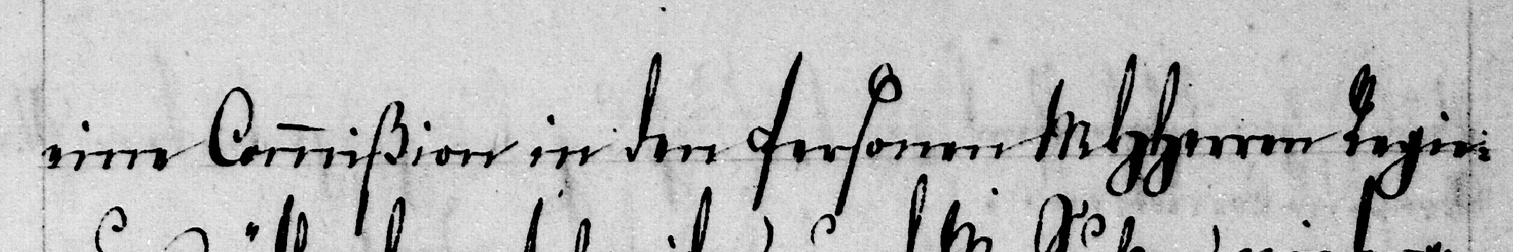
eine Commißion in den Personen MHHerren Regie¬
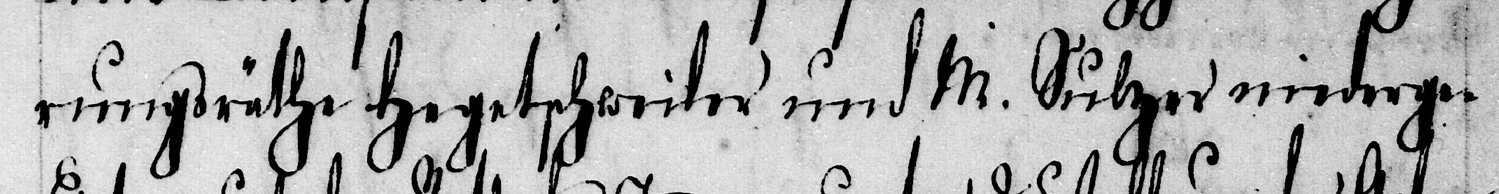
rungsräthe Hegetschweiler und M. Sulzer niederges¬
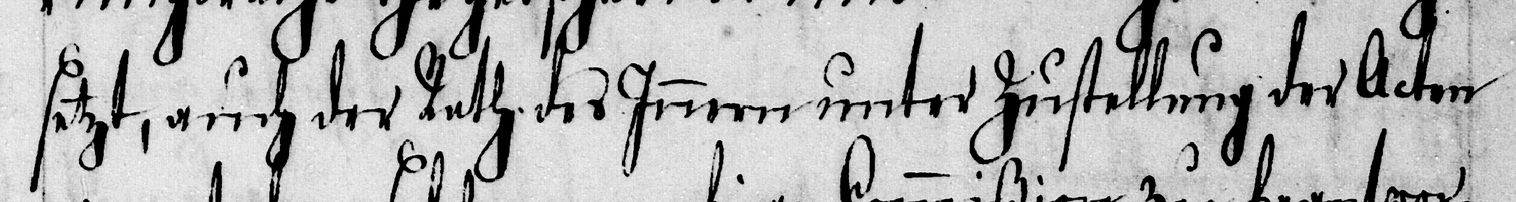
etzt, auch der Rath des Innern unter Zustellung der Acten
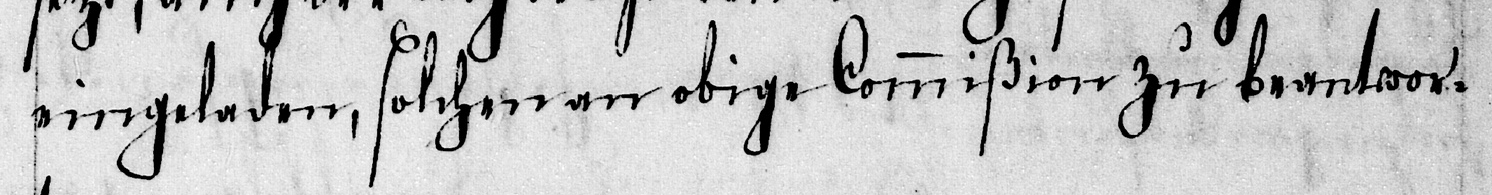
eingeladen, solchen an obige Commißion zu beantwor¬
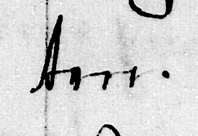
ten.
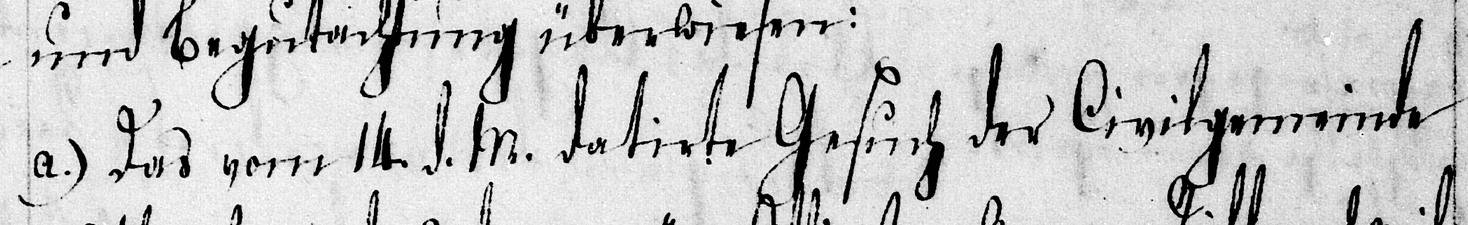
a.) Das vom 14. d. M. datirte Gesuch der Civilgemeinde
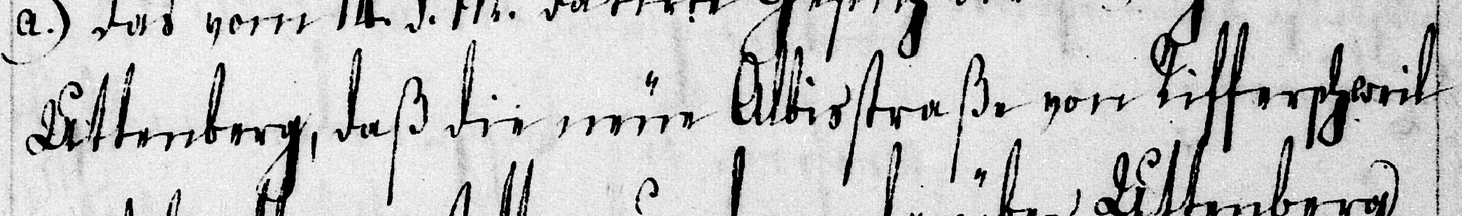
Uttenberg, daß die neue Albisstraße von Rifferschweil
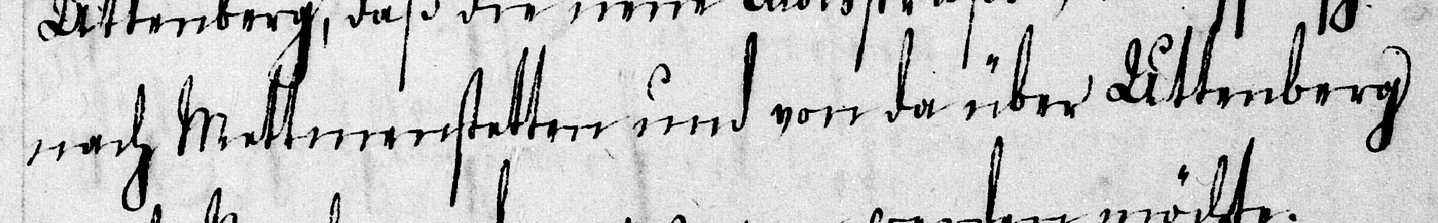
nach Mettmenstetten und von da über Uttenberg
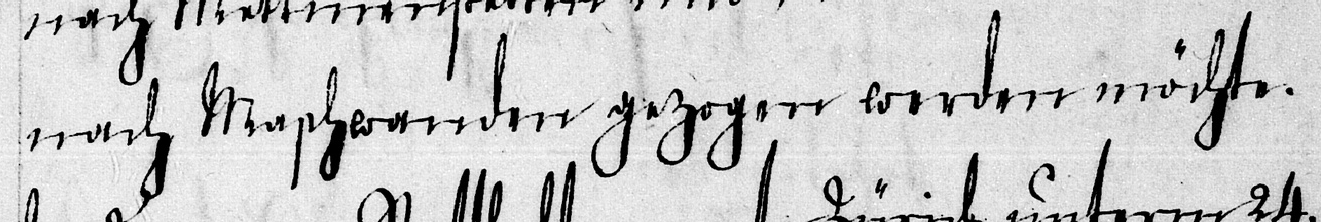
nach Maschwanden gezogen werden möchte.
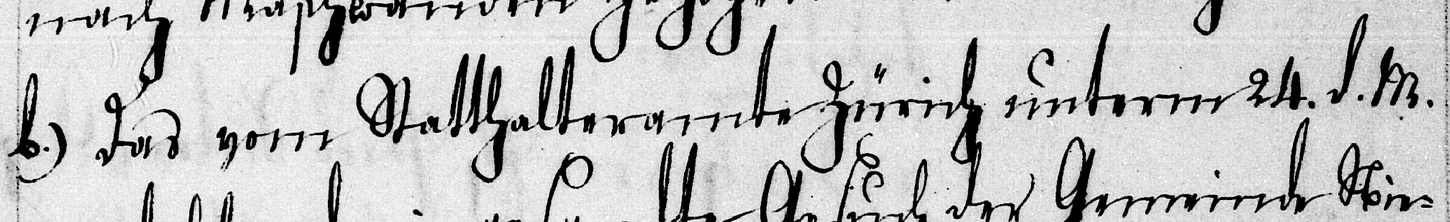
b.) Das vom Statthalteramte Zürich unterm 24. d. M.
